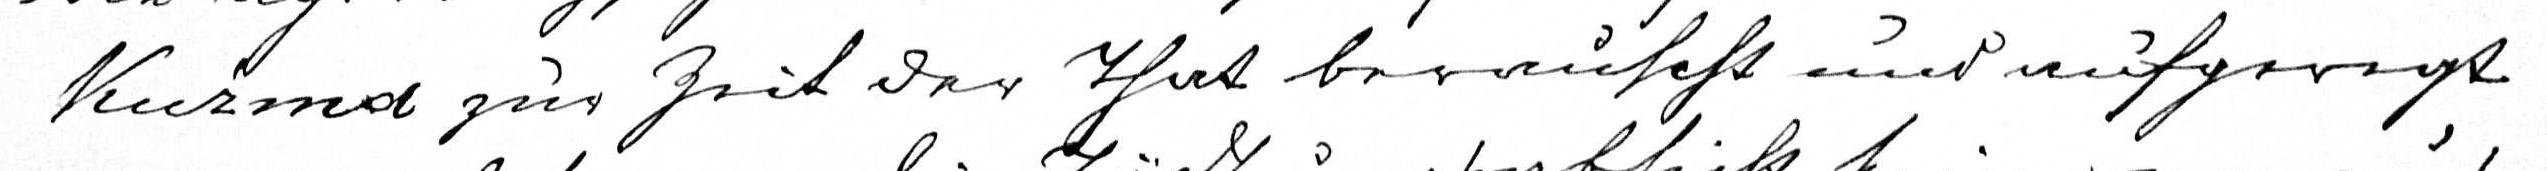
Kuźma Zur Zeit der That berauscht und aufgeregt
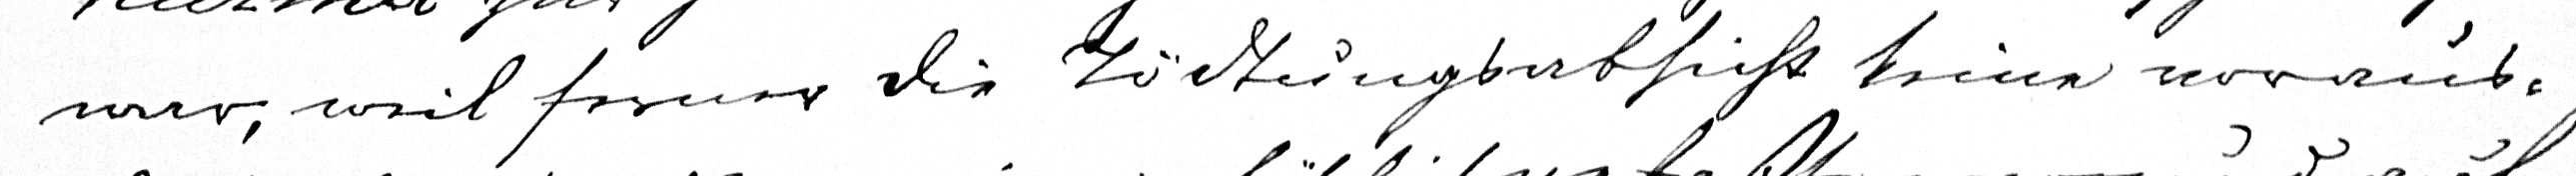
war, weil ferner die Tödtungsabsicht keine voraus¬
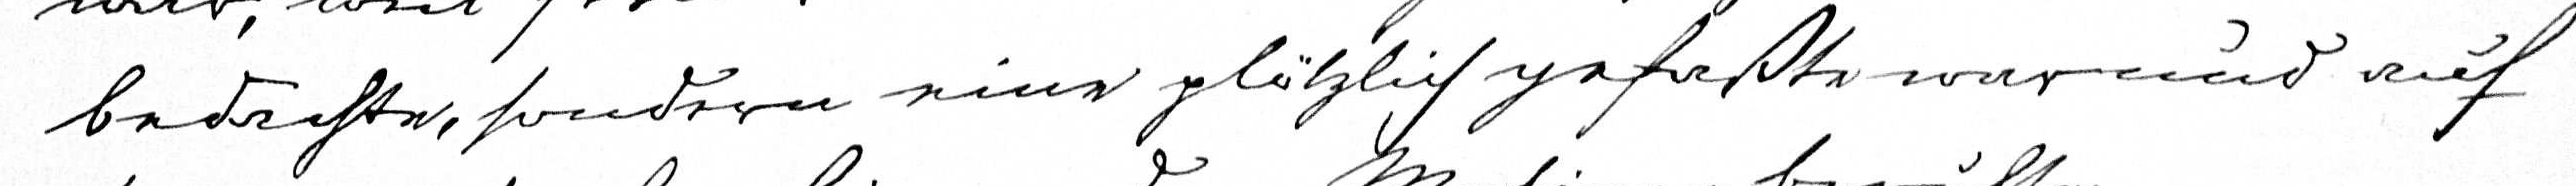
bedachten, sondern eine plötzlich gefaßte war und auf
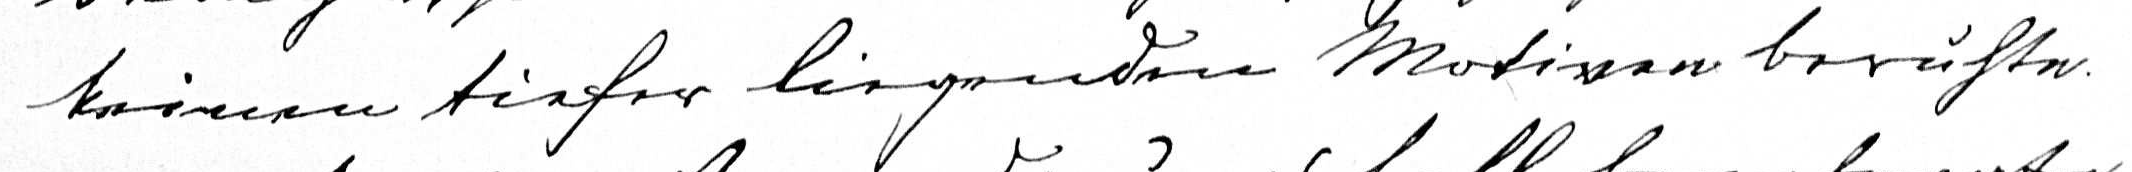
keinen tiefer liegenden Motiven beruhte.
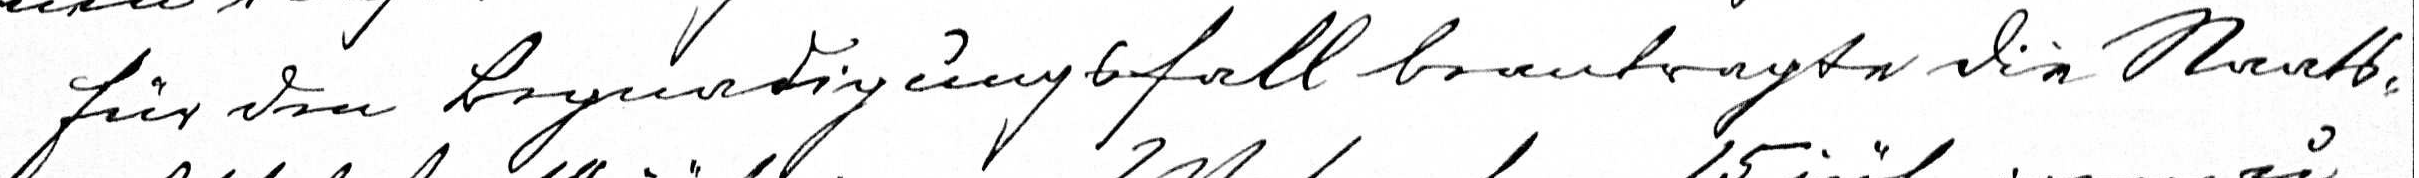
Für den Begnadigungsfall beantragte die Staats¬
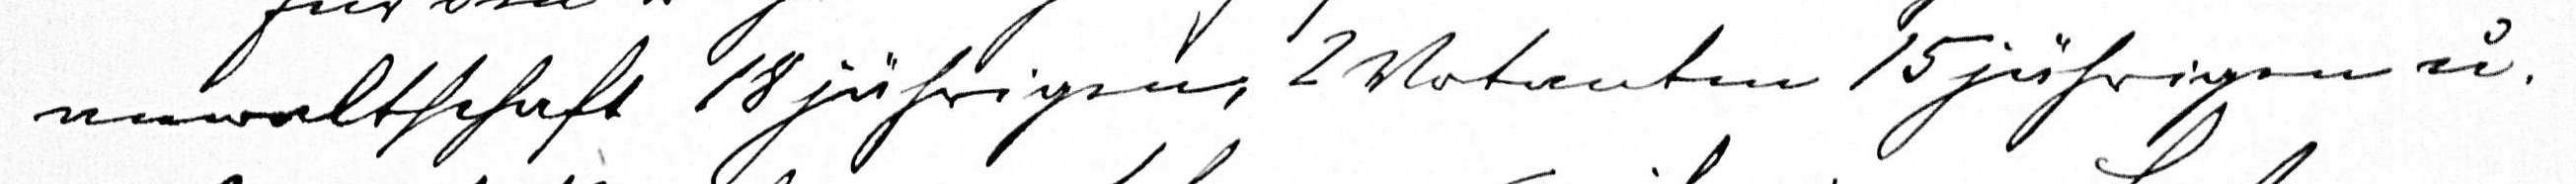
anwaltschaft 18jährigen, 2 Votanten 15jährigen u.
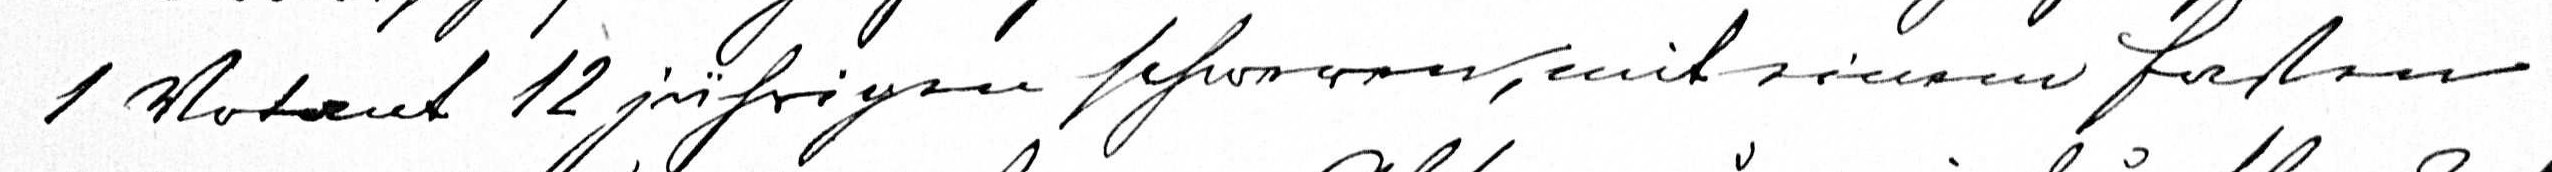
1 Votant 12jährigen schweren, mit einem Fasten
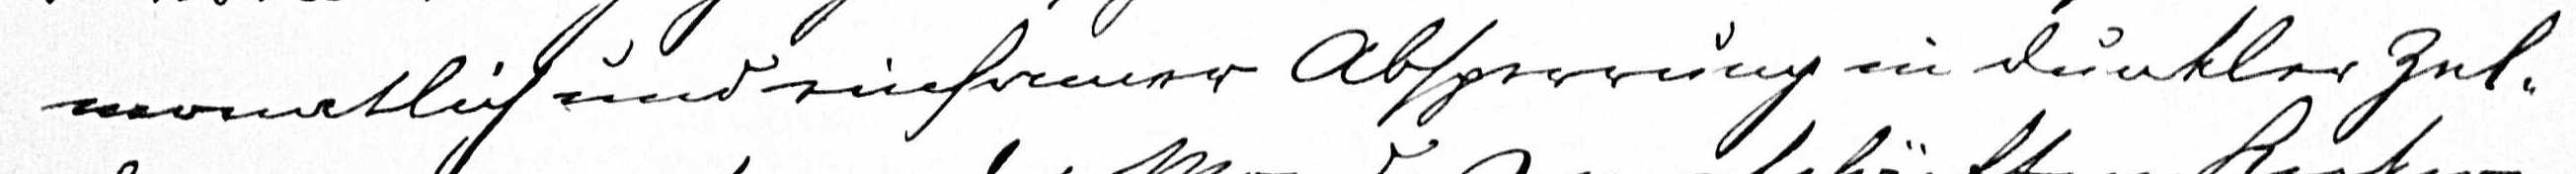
monatlich und einsamer Absperrung in dunkler Zel¬
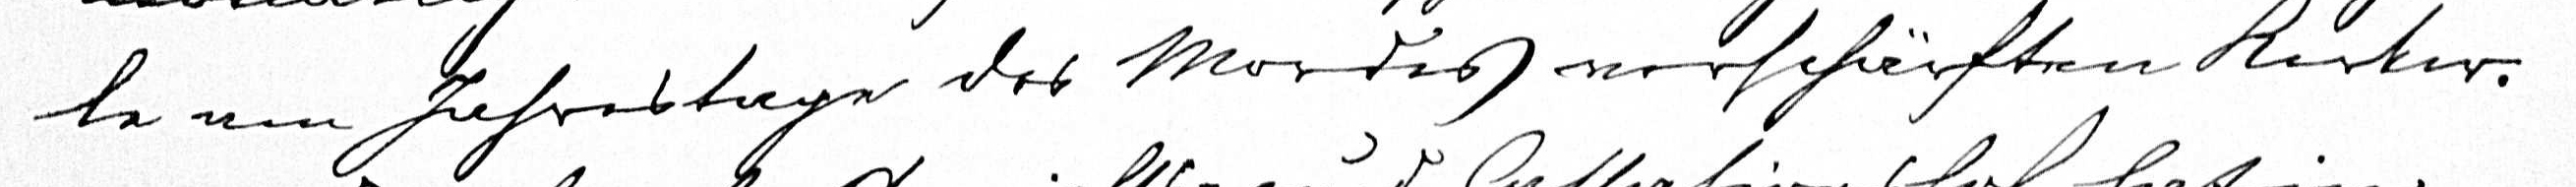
le am Jahrestage des Mondes verschärfte Kerker.
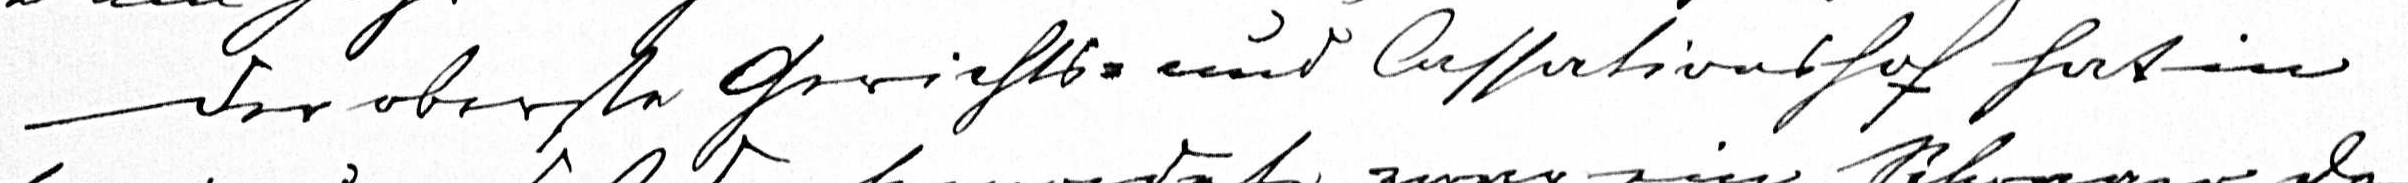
Der oberste Gerichts und Cassationshof hat in
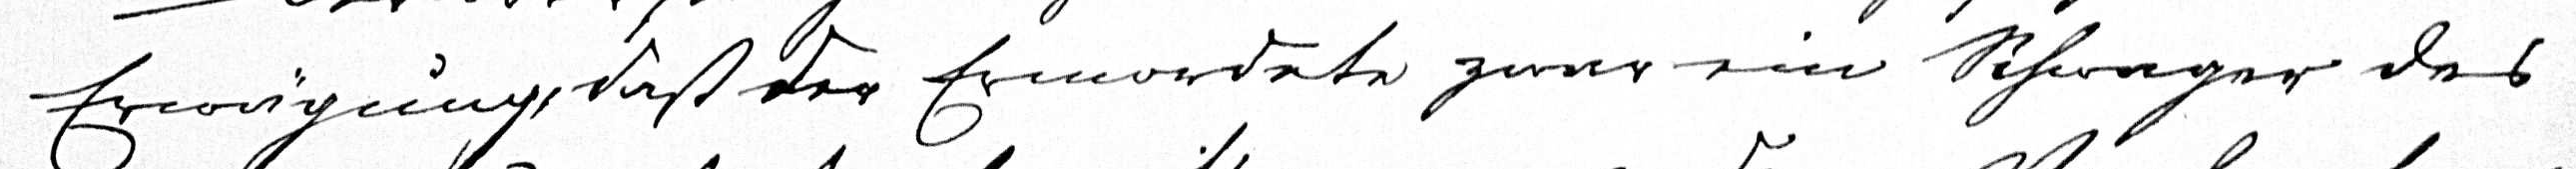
Erwägung, daß der Ermordete zwar ein Schwager des
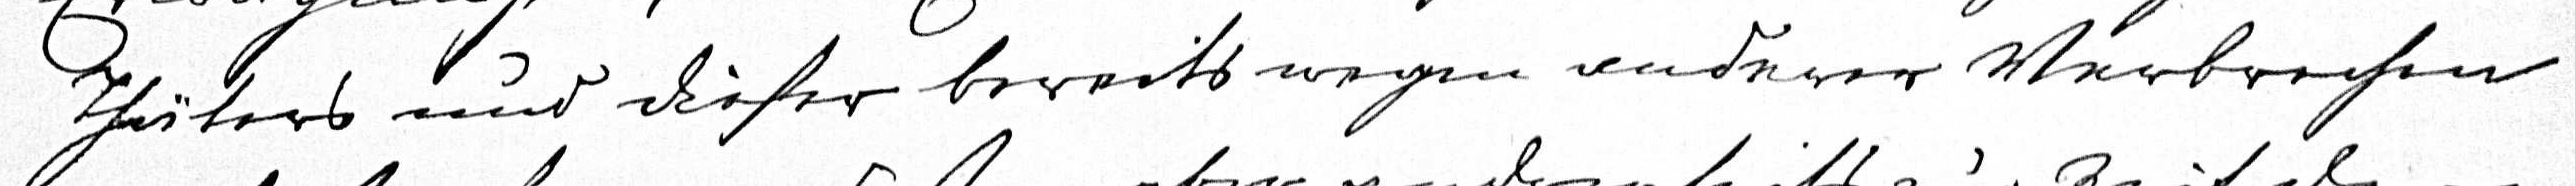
Thäters und dieser bereits wegen anderer Verbrechen
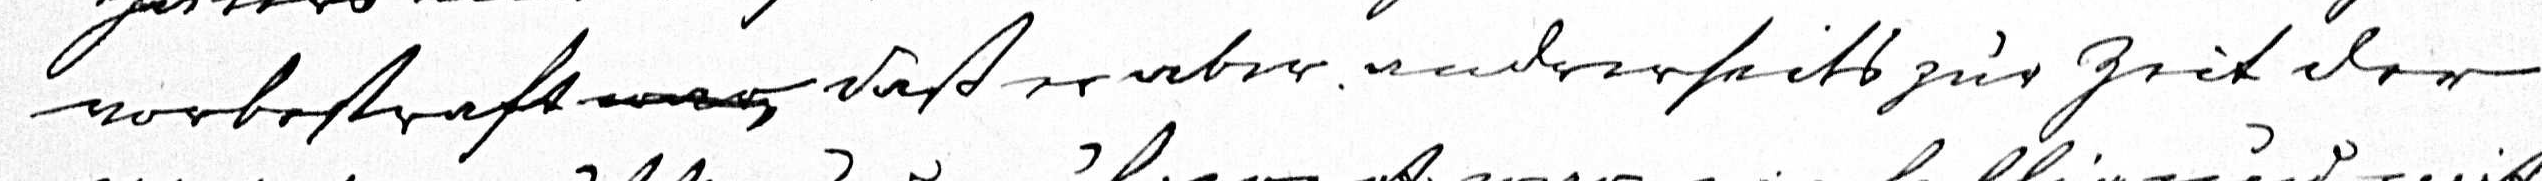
vorbestraft, daß er aber andrerseits zur Zeit der
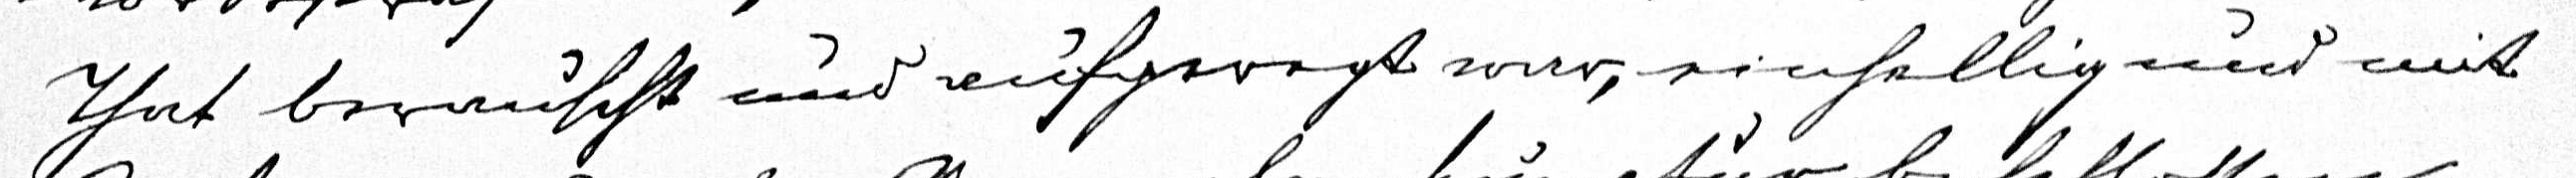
That berauscht und aufgeregt war, einhellig und mit
